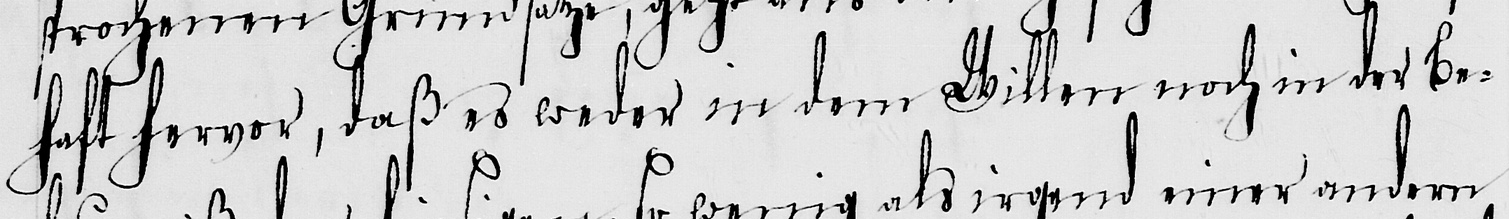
haft hervor, daß es weder in dem Willen noch in der Be¬
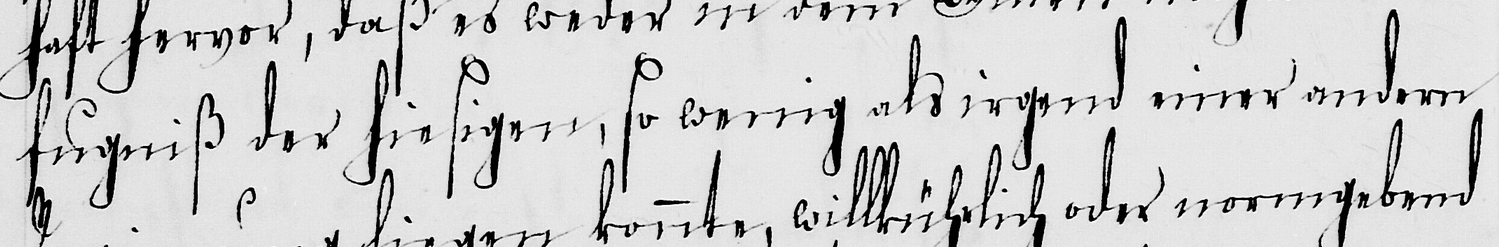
fugniß der hiesigen, so wenig als irgend einer andern
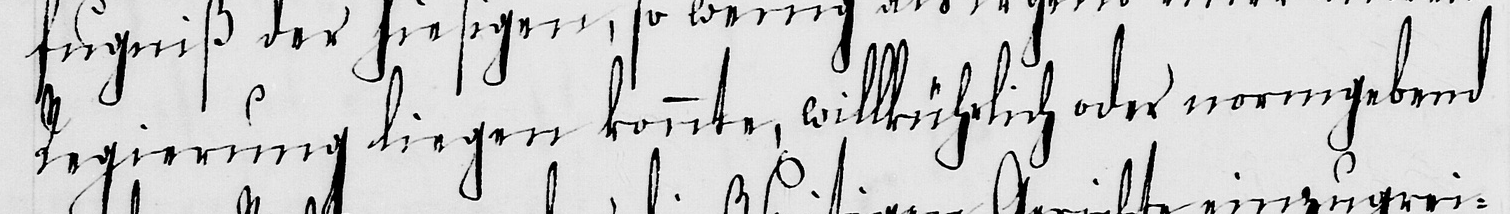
Regierung liegen könnte, willkührlich oder normgebend
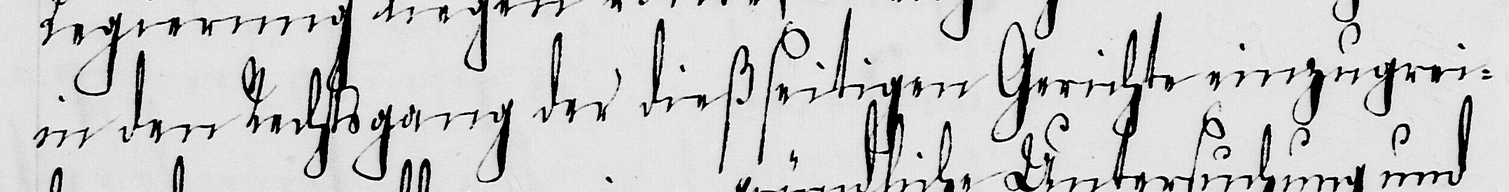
in den Rechtsgang der dießseitigen Gerichte einzugrei¬
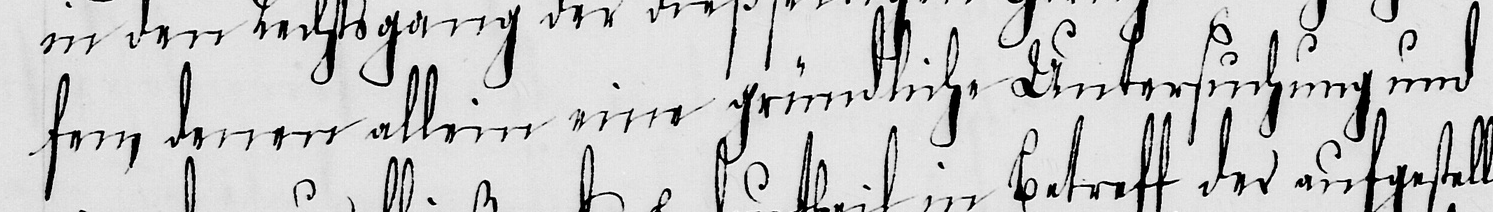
fen, denen allein eine gründliche Untersuchung und
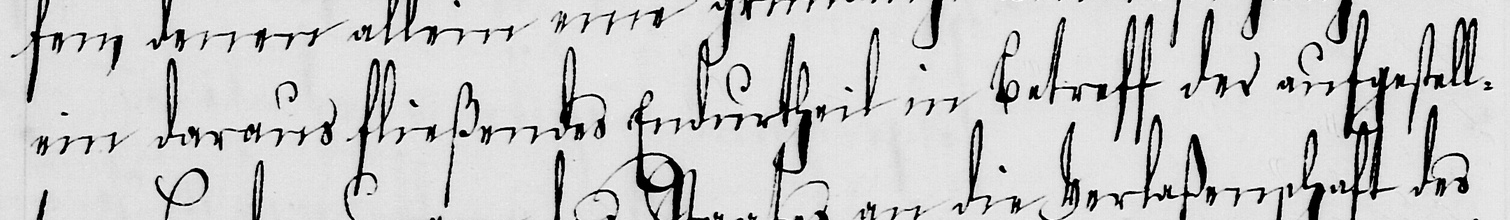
ein daraus fließendes Endurtheil in Betreff der aufgestel¬
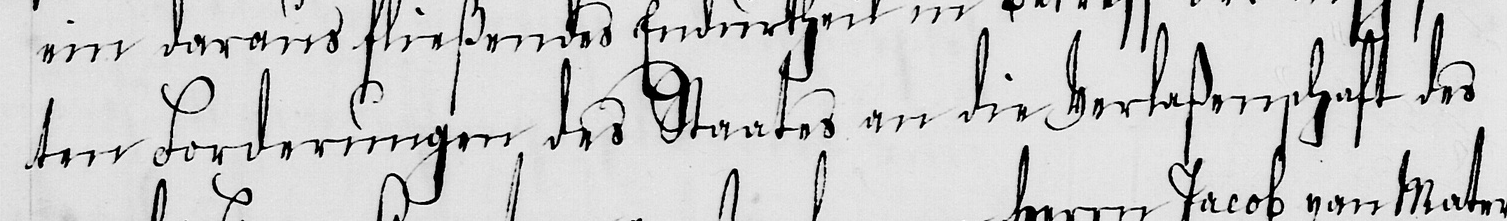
lten Forderungen des Staates an die Verlaßenschaft des
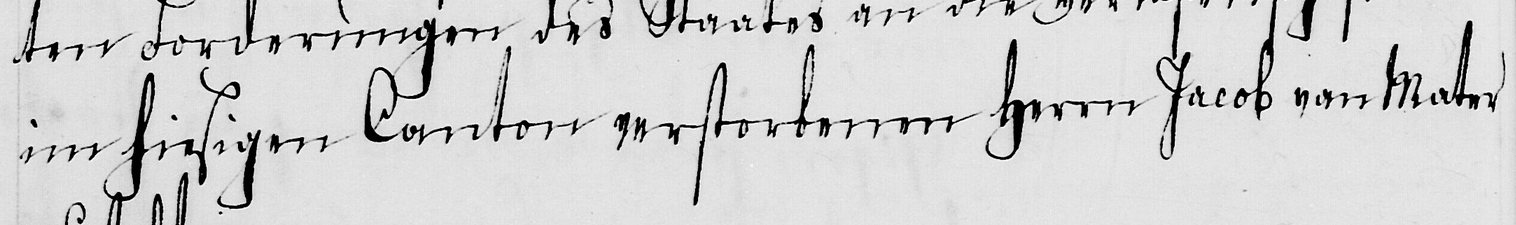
im hiesigen Canton verstorbenen Herrn Jacob von Mater
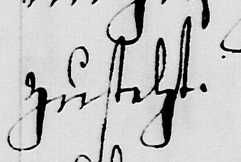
zusteht.
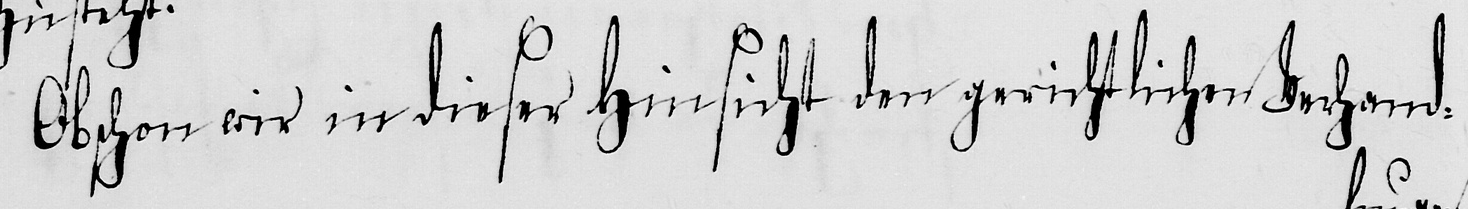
Obschon wir in dieser Hinsicht den gerichtlichen Verhan¬
